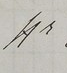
hat.
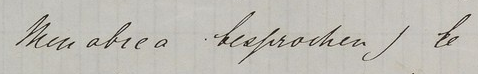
Menabrea besprochen) le
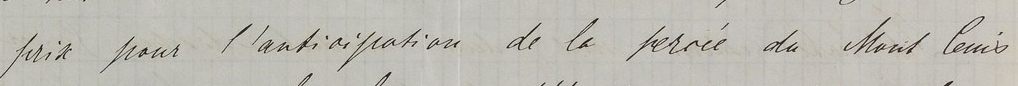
prix pour l'anticipation de la percée du Mont Cenis
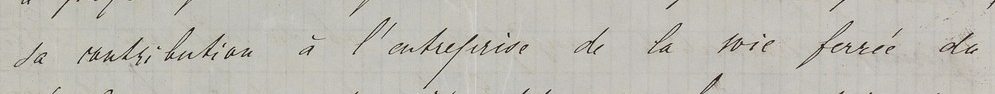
sa contribution l'entreprise de la voie ferrée du
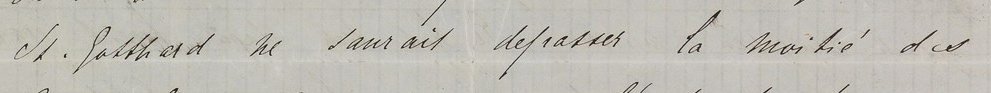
St. Gotthard ne saurait depasser la moitié des
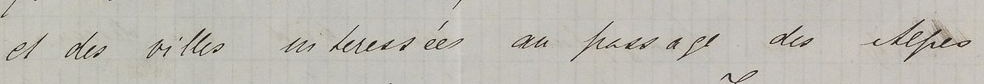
et des villes interessées au passage des Alpes
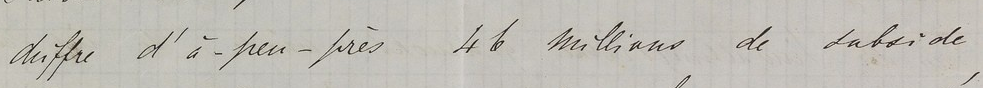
chiffre d'à-peu-près 41 millions de subside.
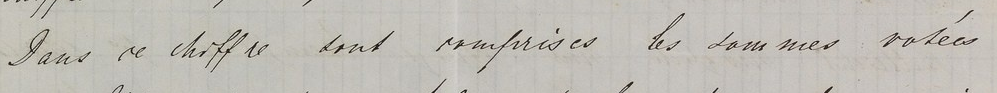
Dans ce chiffre sont comprises les sommes votées
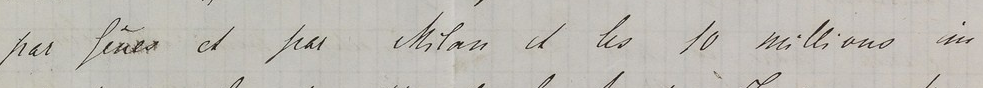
par Gènes et par Milan et les 10 millions im-
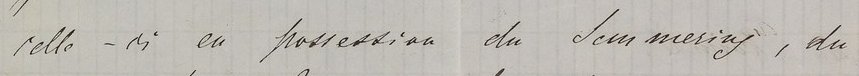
celle-ci en possession du Semmering, du
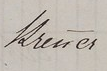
Brenner
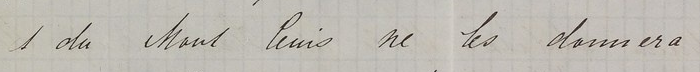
et du Mont Cenis ne les donnera
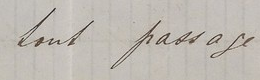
tout passage
